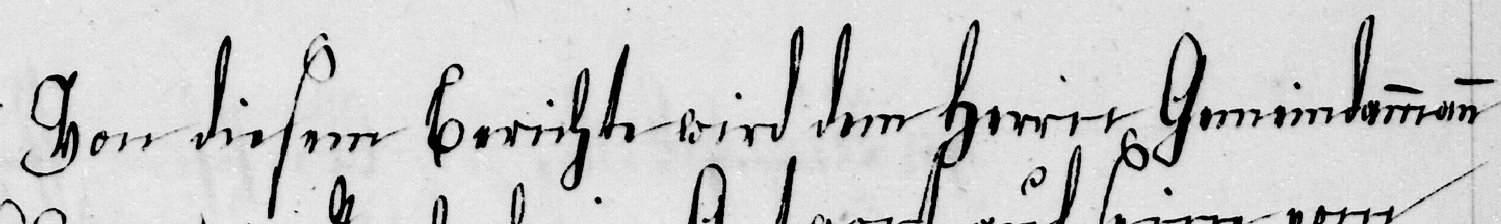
Von diesem Berichte wird dem Herrn Gemeindamm¬
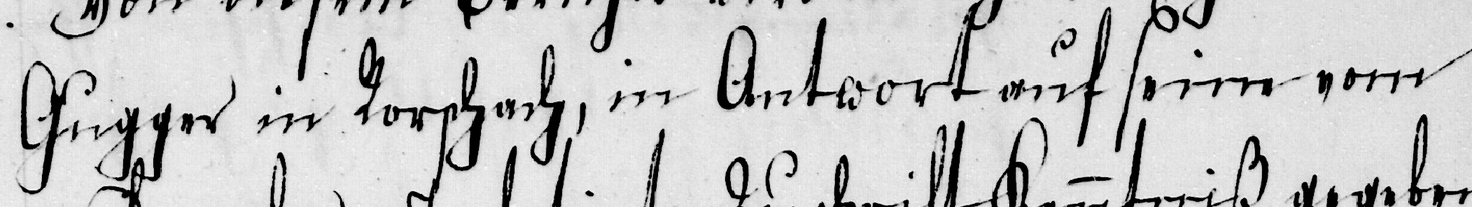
Gugger in Rorschach, in Antwort auf seine vom
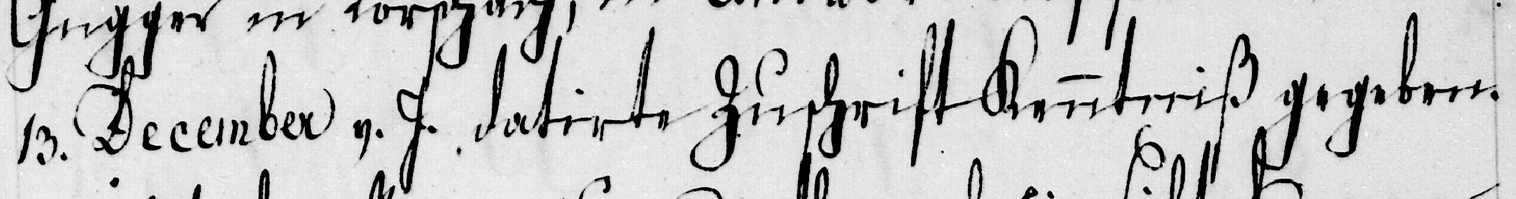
13. December v. J. datirte Zuschrift Kenntniß gegeben.
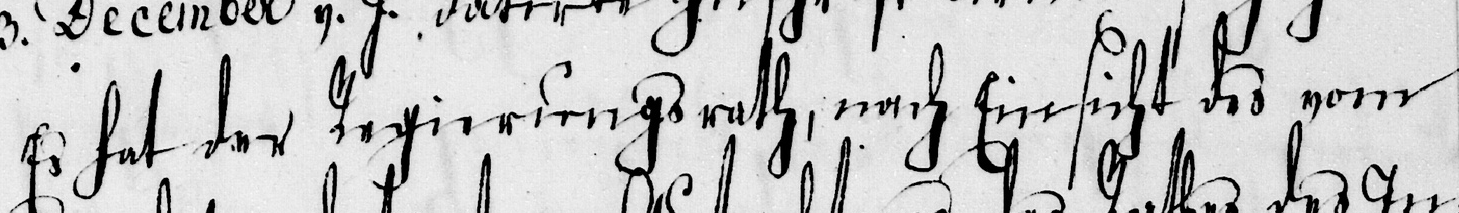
Es hat der Regierungsrath, nach Einsicht des vom
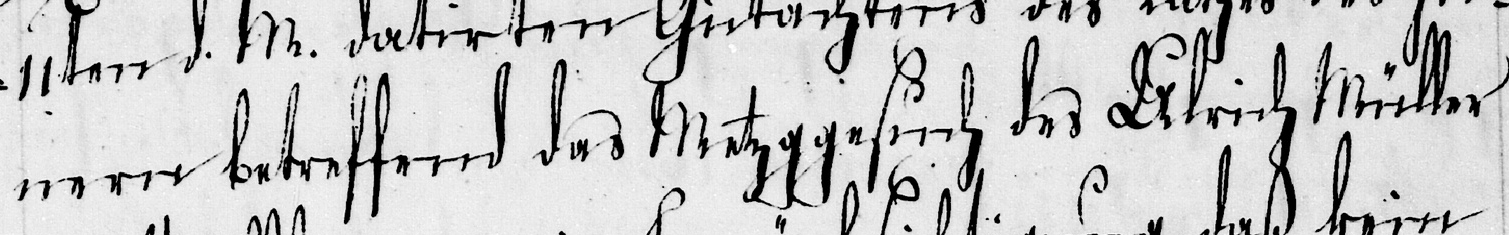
nern betreffend das Metzggesuch des Ulrich Müller
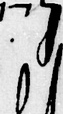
si¬
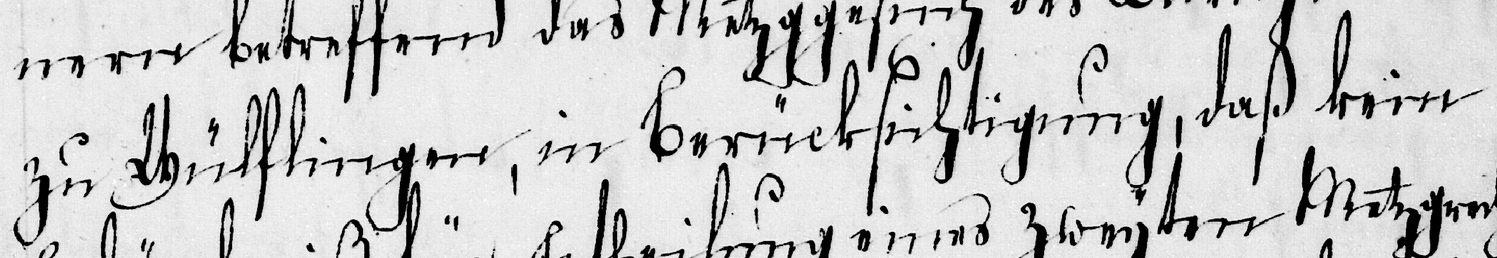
zu Wülflingen, in Berücksichtigung, daß kein
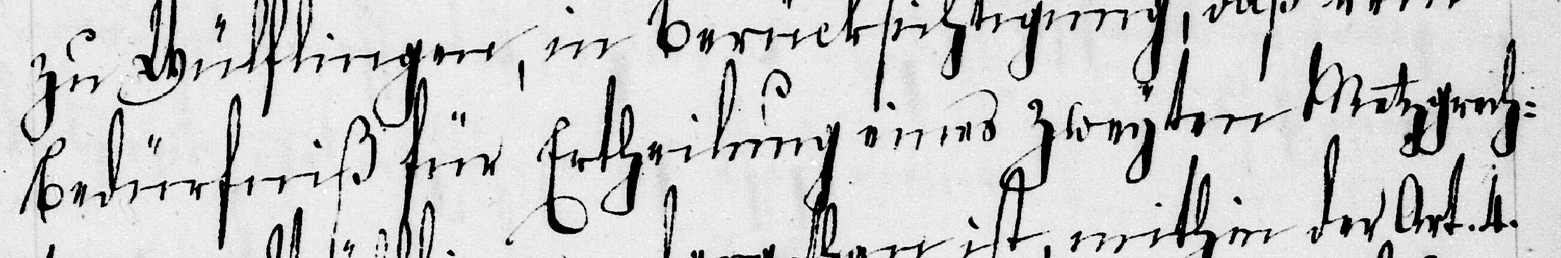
Bedürfniß für Ertheilung eines zweyten Metzgrech¬
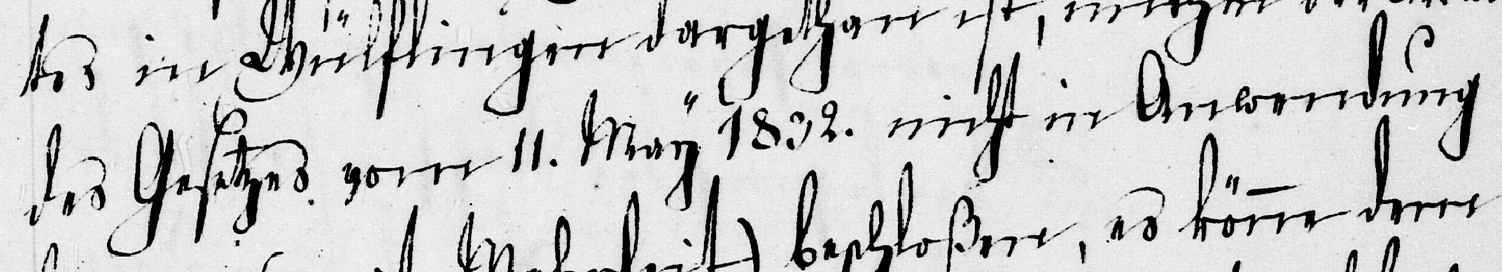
des Gesetzes vom 11. März 1832. nicht in Anwendung
